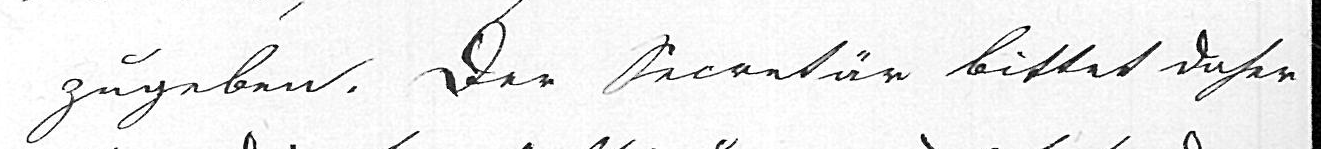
zugeben. Der Secretär bittet daher
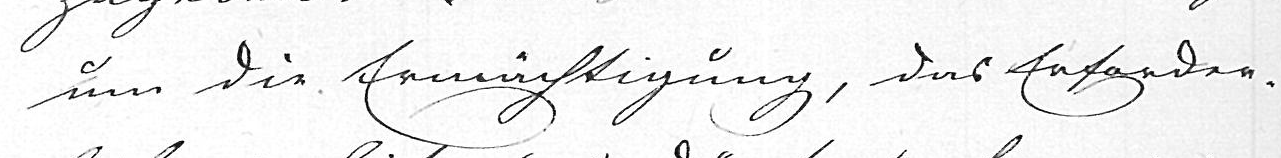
um die Ermächtigung, das Erforder-
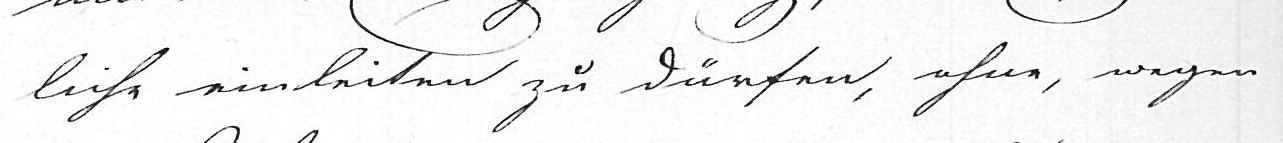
liche einleiten zu dürfen, ohne, wegen
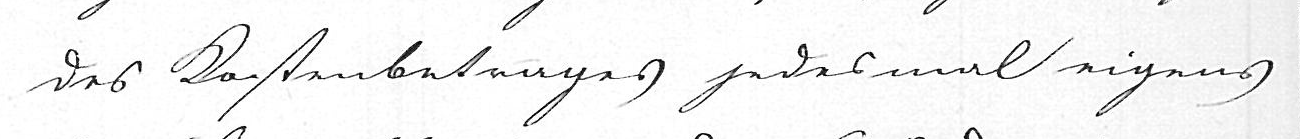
des Kostenbetrages jedesmal eigens
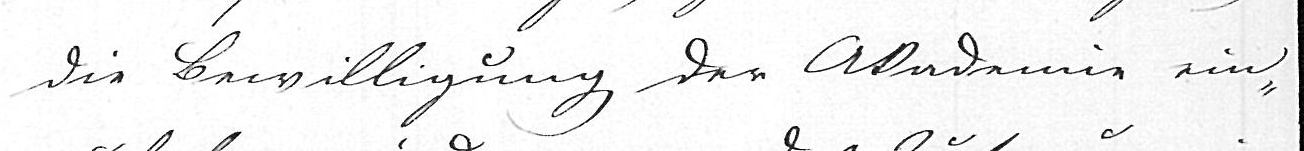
die Bewilligung der Akademie ein-
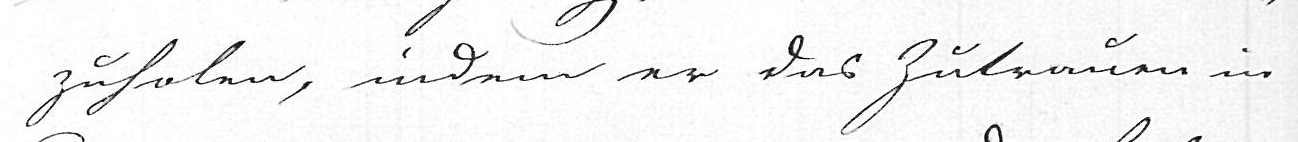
zuholen, indem er das Zutrauen in
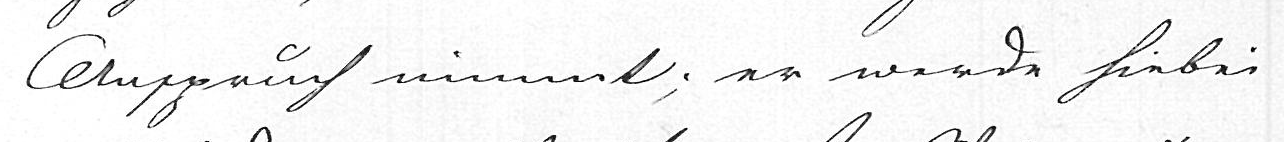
Anspruch nimmt; er werde hiebei
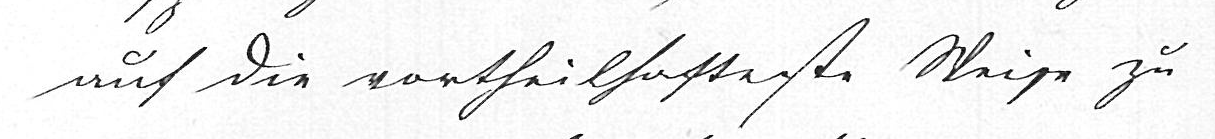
auf die vortheilhafteste Weise zu
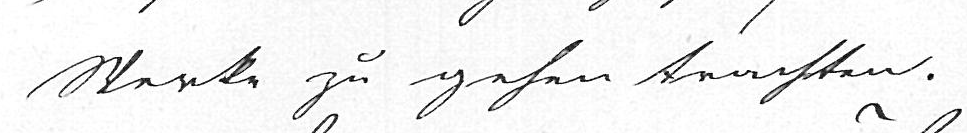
Werken zu gehen trachten.
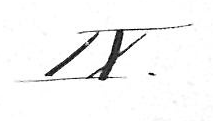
IX.
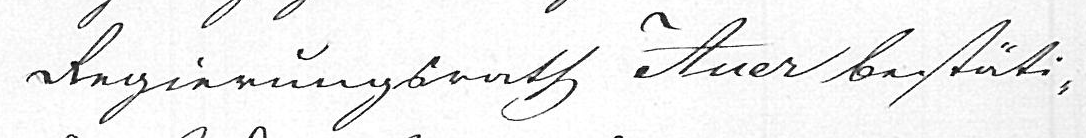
Regierungsrath Auer bestäti-
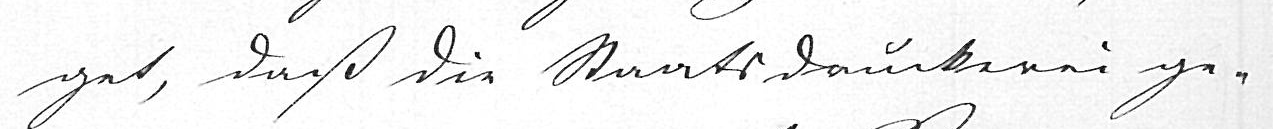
get, daß die Staatsdruckerei ge-
